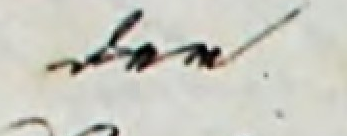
der
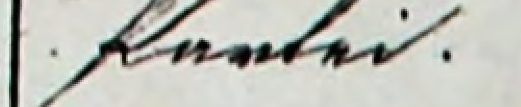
Partei.
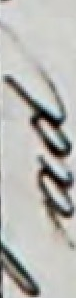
ad
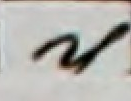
J.
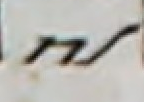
K.
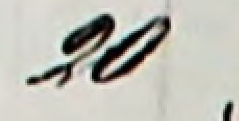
20
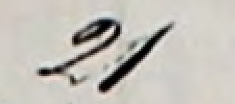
21
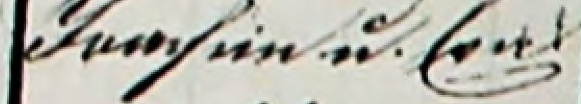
Joachim u. Eva
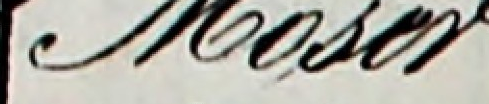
Moser
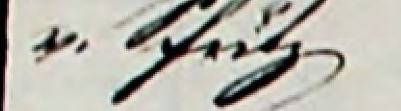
v. Schütz
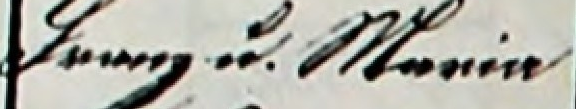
Franz u. Maria
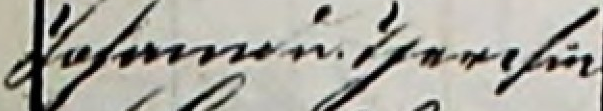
Johann u. Theresia
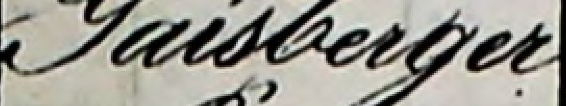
Gaisberger
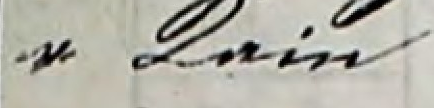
v Kain
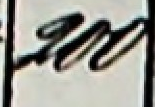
200
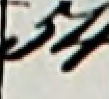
54
